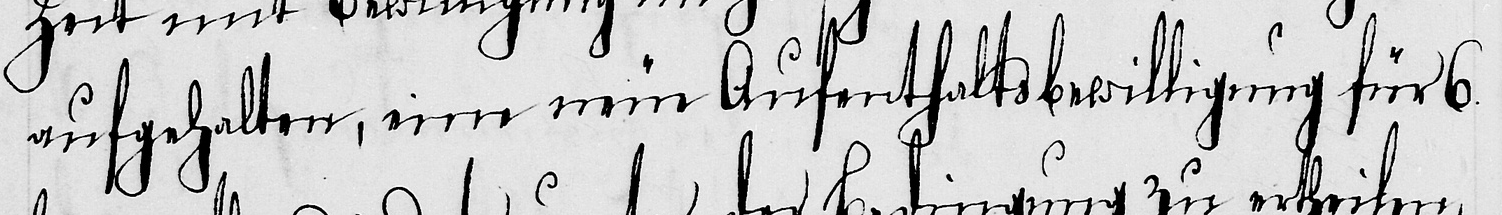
aufhalten, eine neue Aufenthaltsbewilligung für 6.
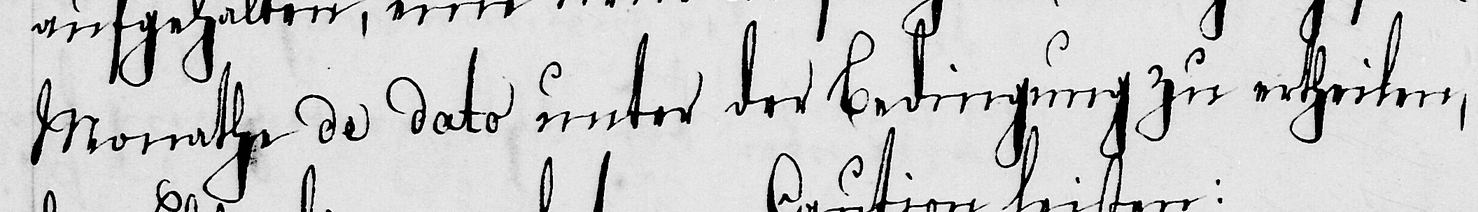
Monathe de dato unter der Bedingung zu ertheilen,
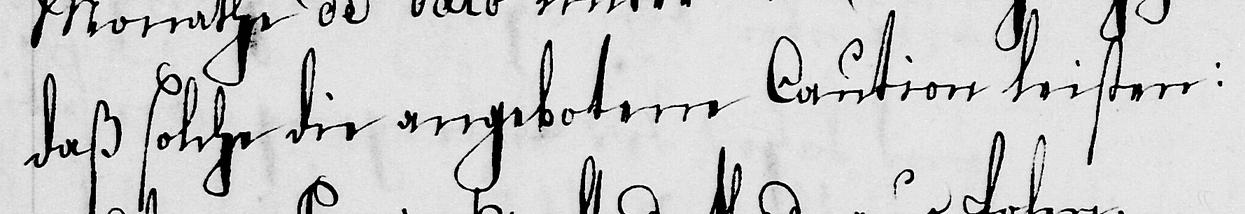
daß solche die angebotene Caution leisten:
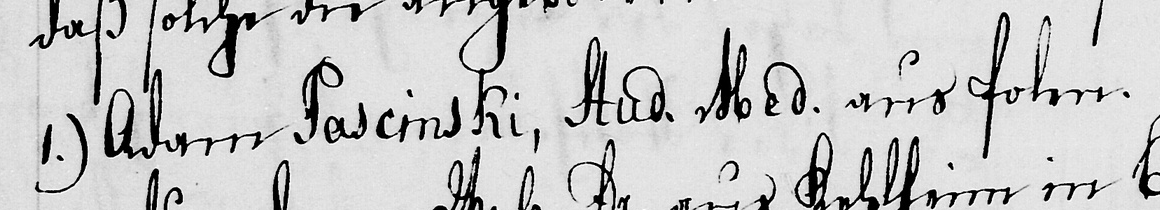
1.) Adam Pascinski, Stud. Med. aus Polen.
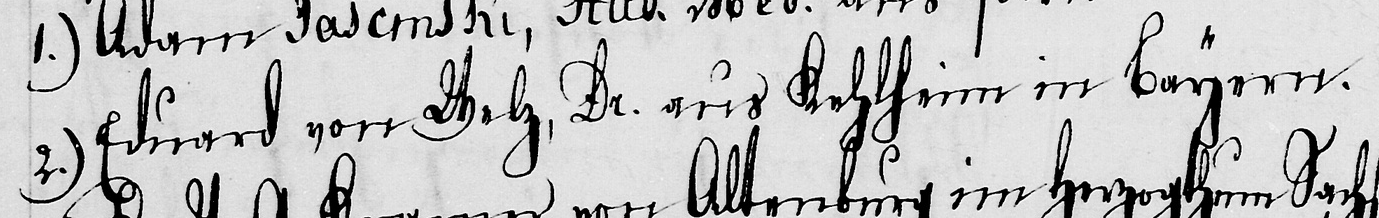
2.) Eduard vom Welz, Dr. aus Kehlheim in Bayern.
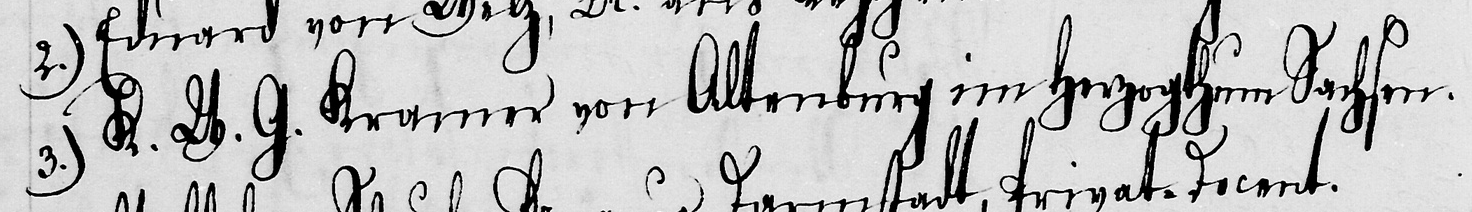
3.) K. W. G. Kramer von Altenburg im Herzogthum Sachsen.
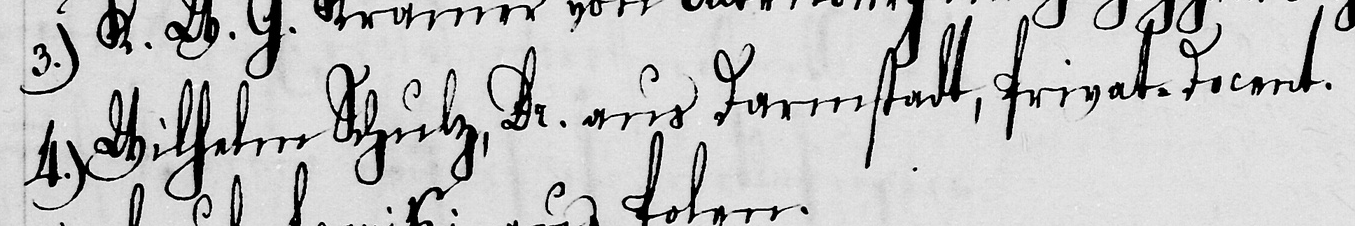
4.) Wilhelm Schulz, Dr. aus Darmstadt, Privat-Docent.
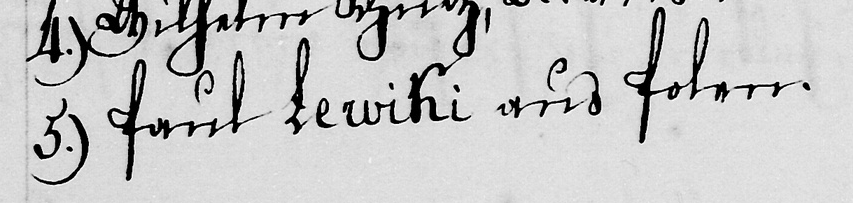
5.) Paul Lewiki aus Polen.
